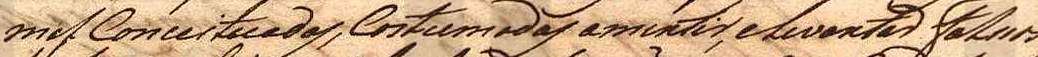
mal Conceituadas, Costumadas a mentir, e levantar falssos
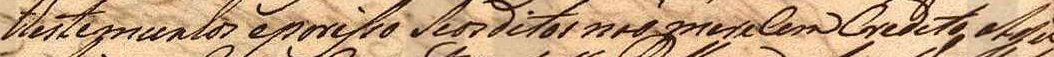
testemunhos e por isso seos ditos naõ merecem Credito algū
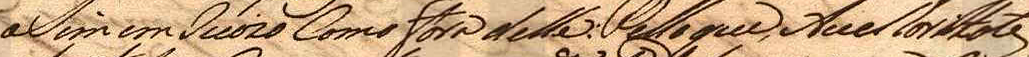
aSim em Iuizo Como fora delle: Pello que, Aucthoritate
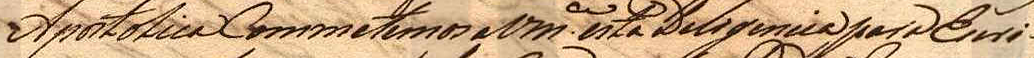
Apostolica Commetemos a vm.ce esta Deligencia, para Escri
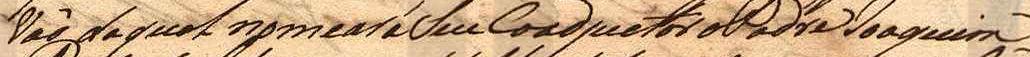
Vaõ da qual nomeará Seu Coadjutor o Padre Ioaquim
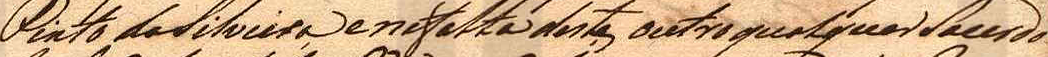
Pinto da Silveira, e na falta deste, outro qualquer sacerdo
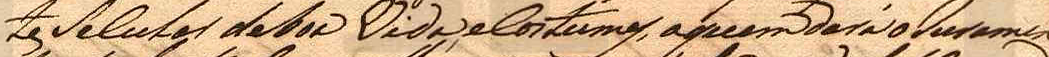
te seCular de boa Vida, e Costumes, a quem dará o Iuramen
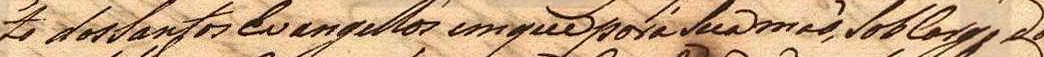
to dos Santos Evangelhos em que porá Sua maõ, Sob Cargo do
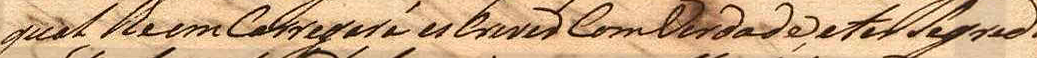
qual lhe emCarregará escrever Com Verdade, e ter segredo
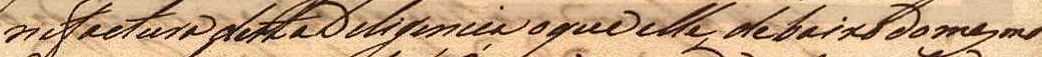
na factura desta Deligençia o que elle, debaixo do mesmo
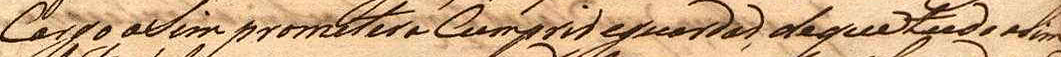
Cargo aSim prometerá Cumprir e guardar, de que tudo aSim
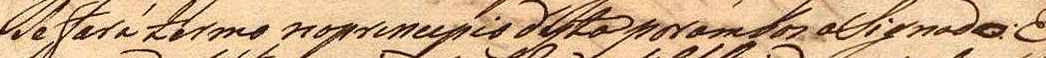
se fará termo no prencepio desta por ambos aSignado. E
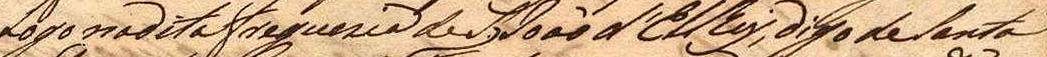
Logo na dita freguezia de S. João d´El Rey, digo de Santa
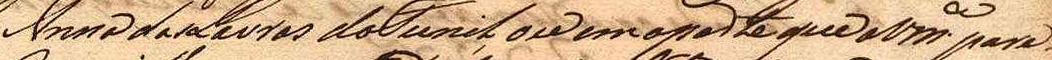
Anna das Lavras do Funil, ou em a parte que a V M.ce pare
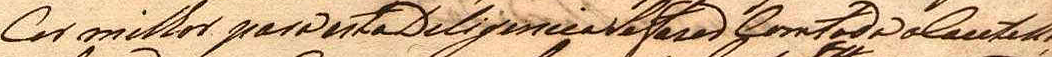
Cer milhor para esta Deligencia se fazer Com toda a Cautella,
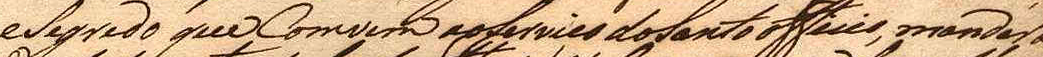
e segredo que Convem ao Serviço do Santo officio, mandara
